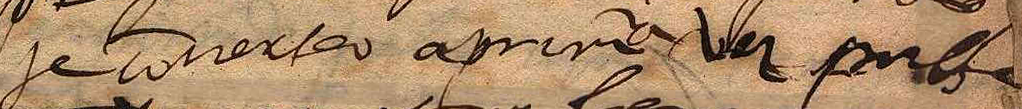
se c̄ouerteo a primra vez por lhe
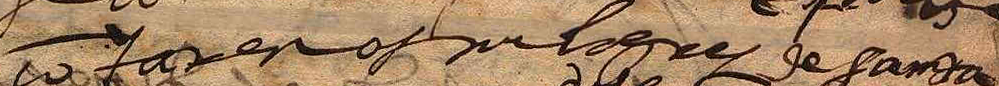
c̄otaren os milagres de samta
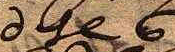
dise q̄
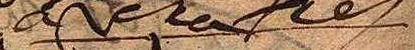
avera tres
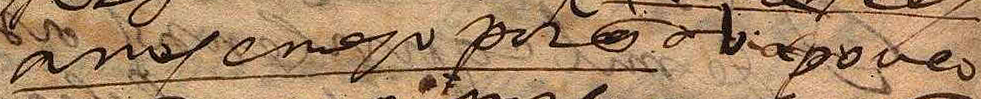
anos e mejo porq̄ avia pouco
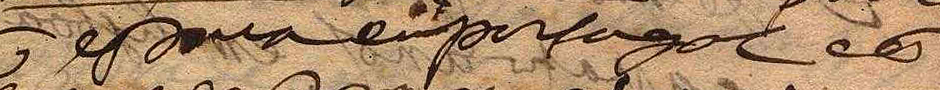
q̄ estaua em portugal e q̄
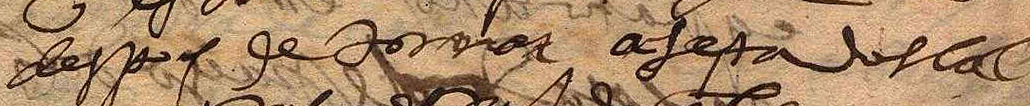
despos de tornar a sejta dos Cal
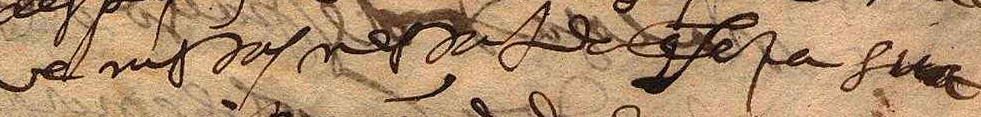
venistas nesta Jda q̄ fez a sua
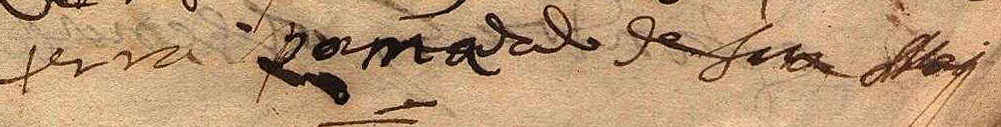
terra por mādado de sua Maj
